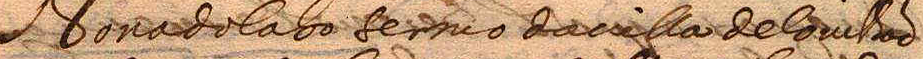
Noua do Cabo termo da uilla de Couilhaõ
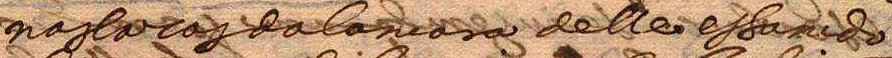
nas Cazas da Camara delle estando
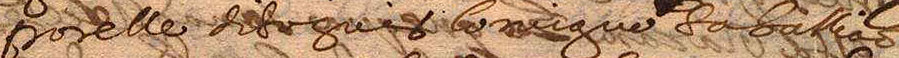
por elle dito juis Comiguo taballiaõ
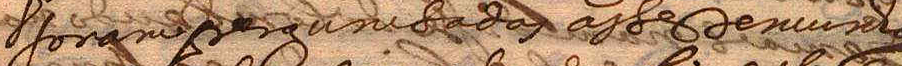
foram pergumtadas as testemunhas
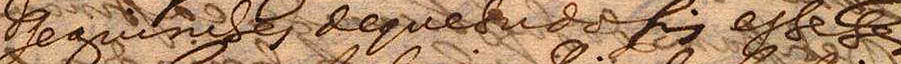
seguimtes de que tudo fis este ter
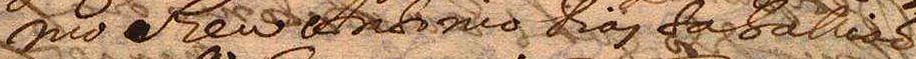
mo _ E eu Antonio Pias taballiaõ
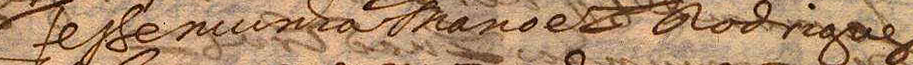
Testemunha Manoel Rodrigues
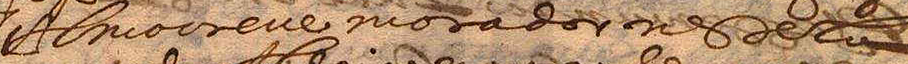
Almocreue morador neste lu
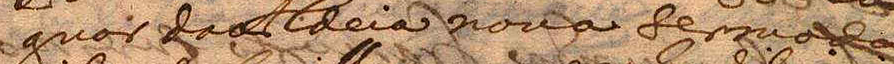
guar da Aldeia noua termo da
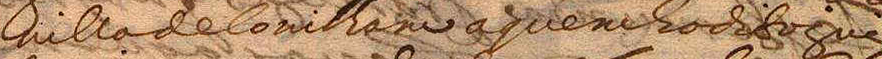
uilla de Couilham a quem ho dito juis
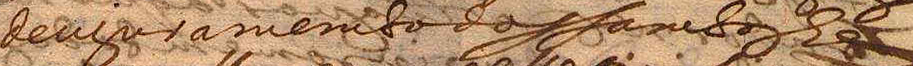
deu juramemto dos samtos he
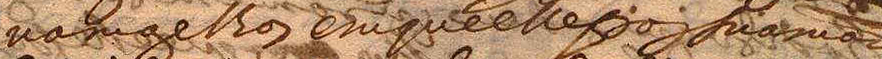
uamgelhos em que elle pos sua maõ
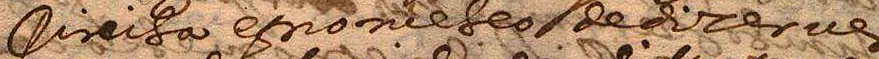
Direita e prometeo de dizer uer
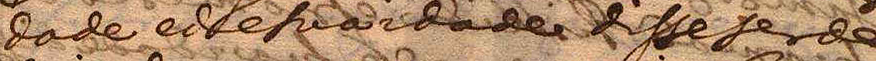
dade e de sua idade disse ser de
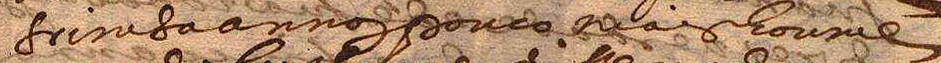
trimta annos pouco mais hou me
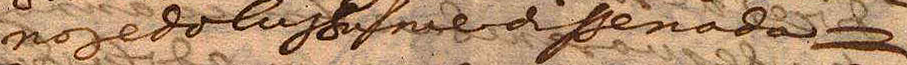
nos e do Custume disse nada =
